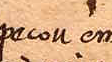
pecou em
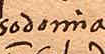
sodomia
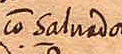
cō Saluador
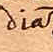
diāz
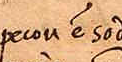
pecou ē sodo
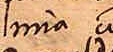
mia cō
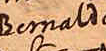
Bernaldo
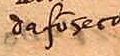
da fōseca
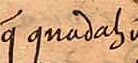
q̄ quada hū
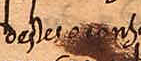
destes o conhe
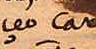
ceo carnal
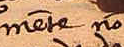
mēte no
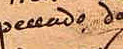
peccado da
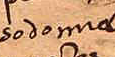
sodomia
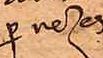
ꝑ uezes
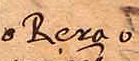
o R era o
